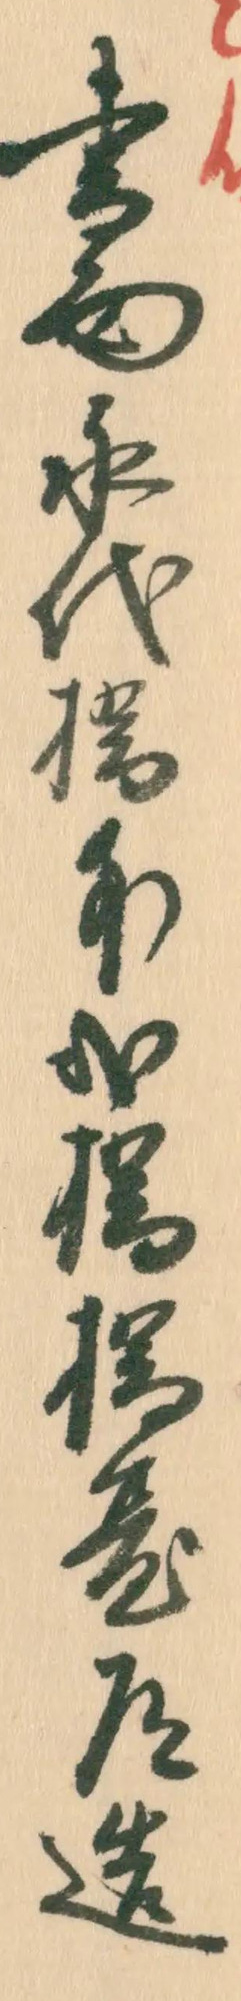書面永代橋外弐橋橋台道造
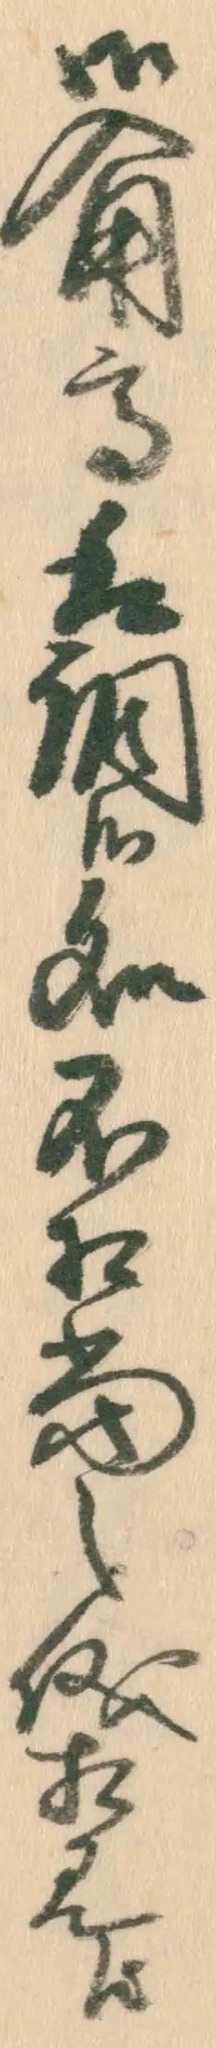御入用高取調候処不相当之儀相見え
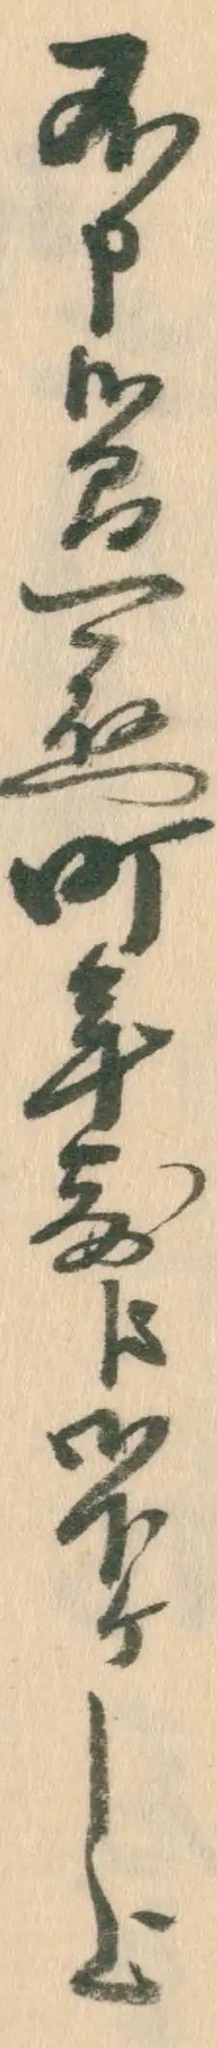不申候間一応町年寄え御下ケ之上
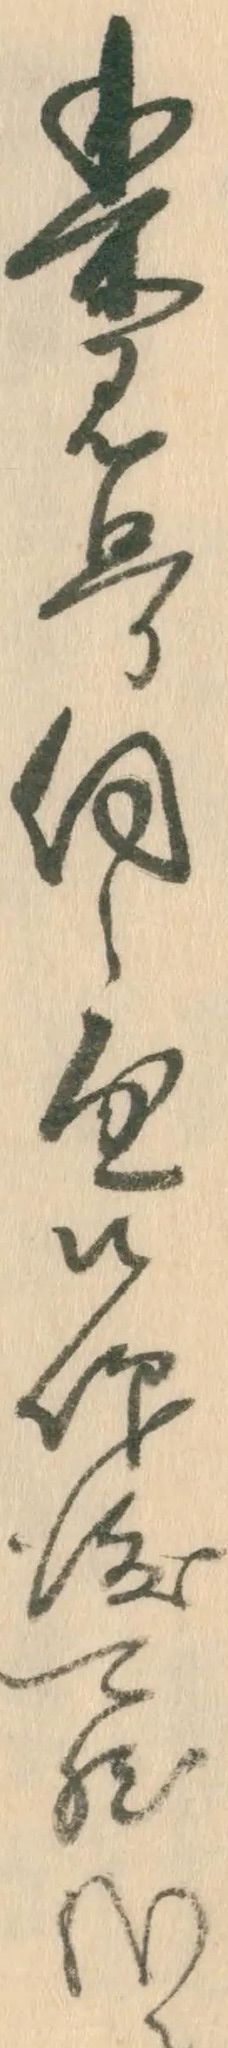本所見廻り伺之通被仰渡可然哉ニ
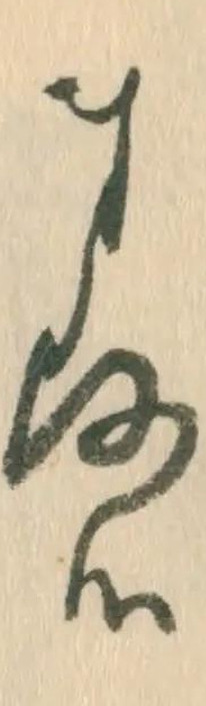奉存候
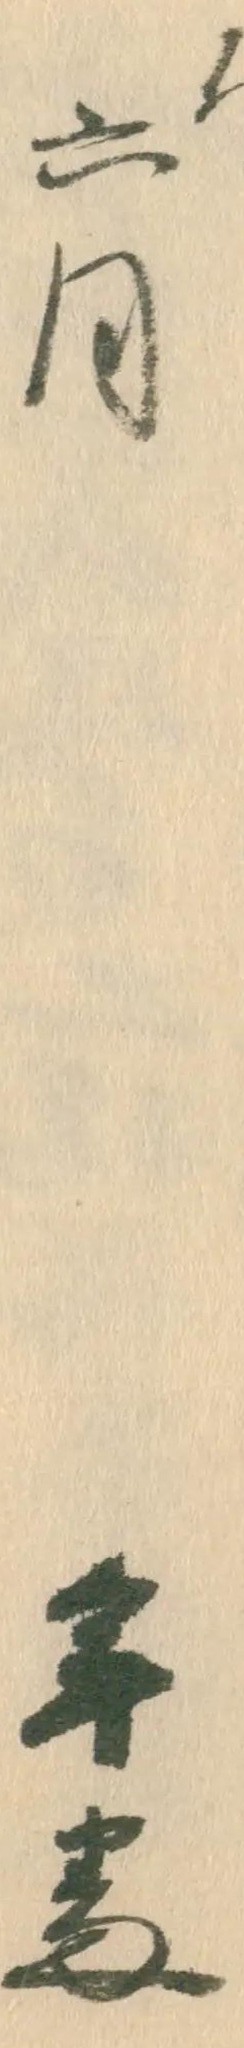六月年番

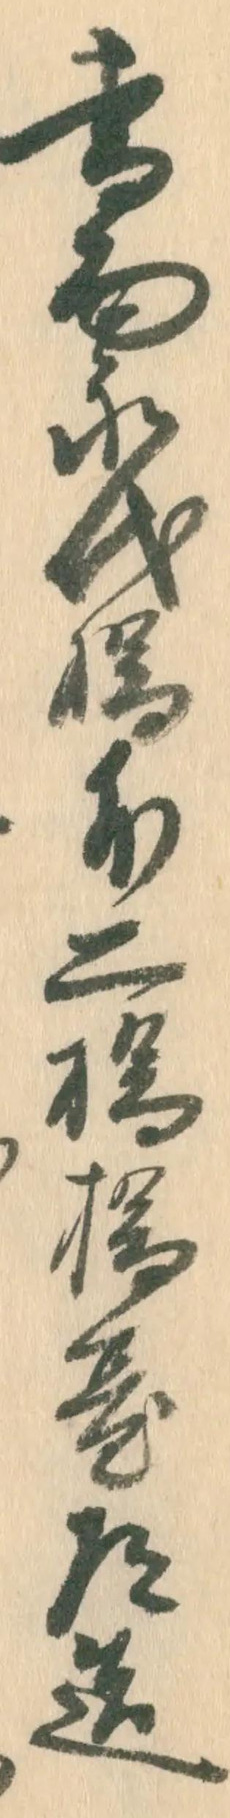書面永代橋外二橋橋台道造
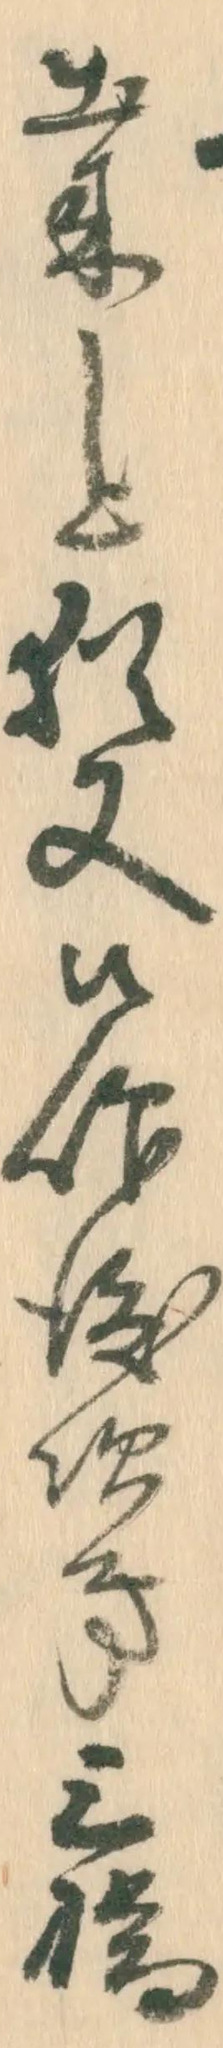出来之上猶又被仰渡次第三橋
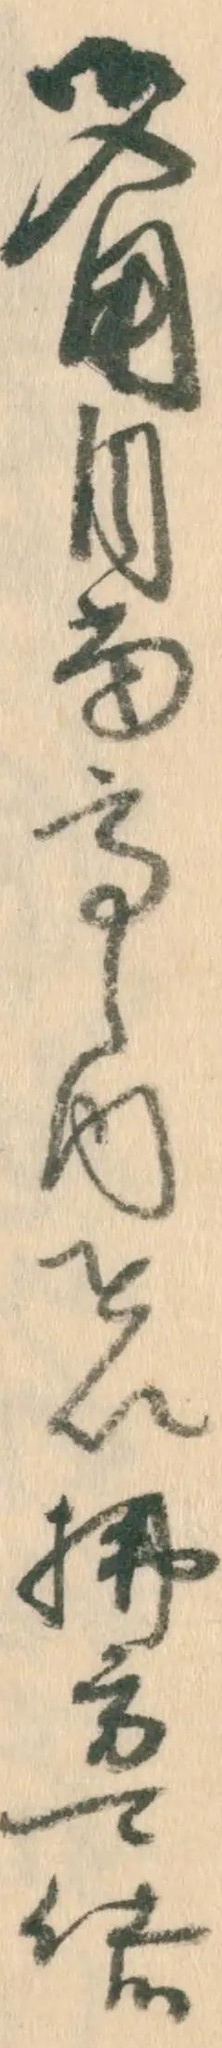御入用目当高之内を以払方可仕候
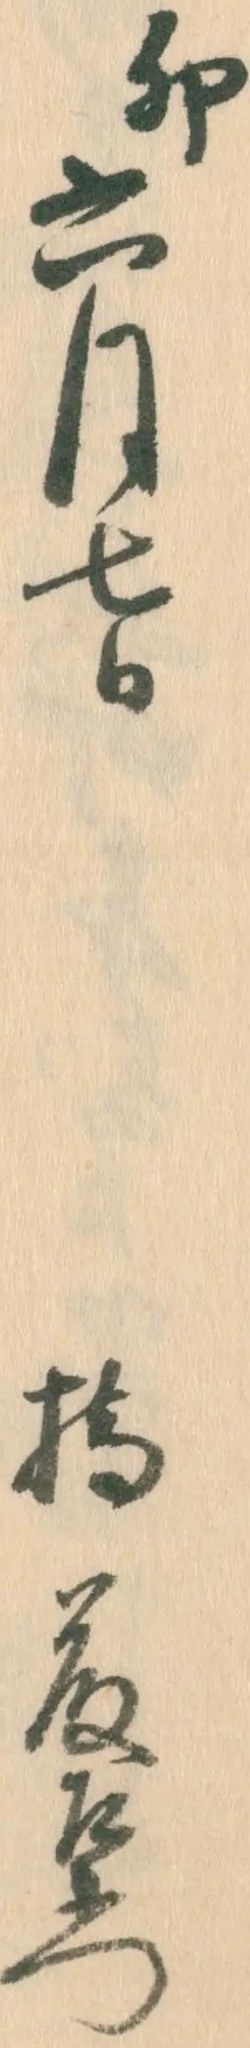六月七日樽藤左衛門
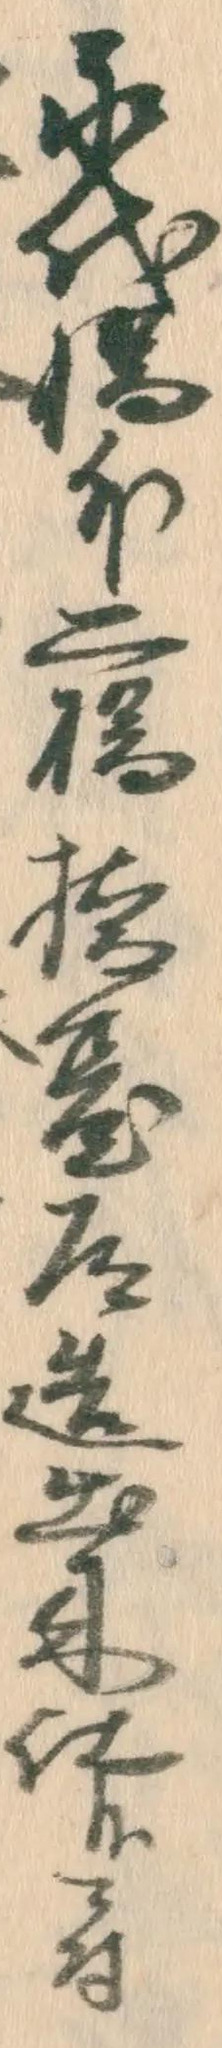永代橋外二橋橋台道造出来仕候ニ付
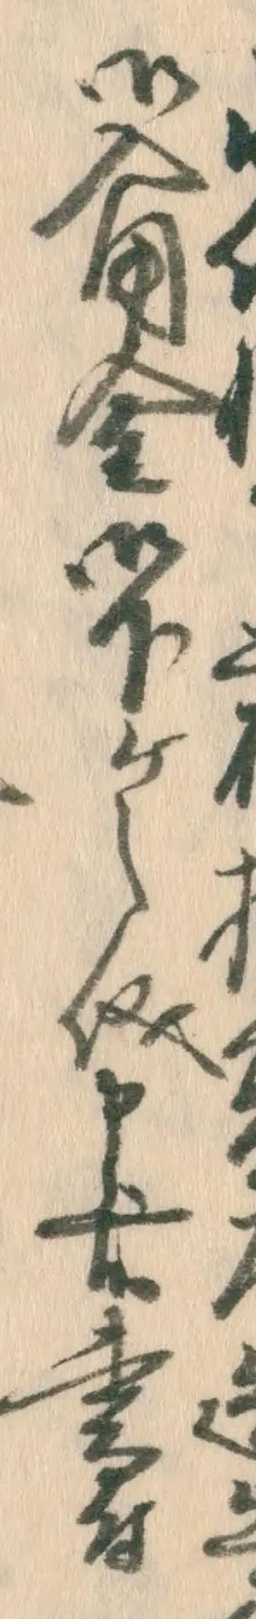御入用金御下ケ之儀申上候書付
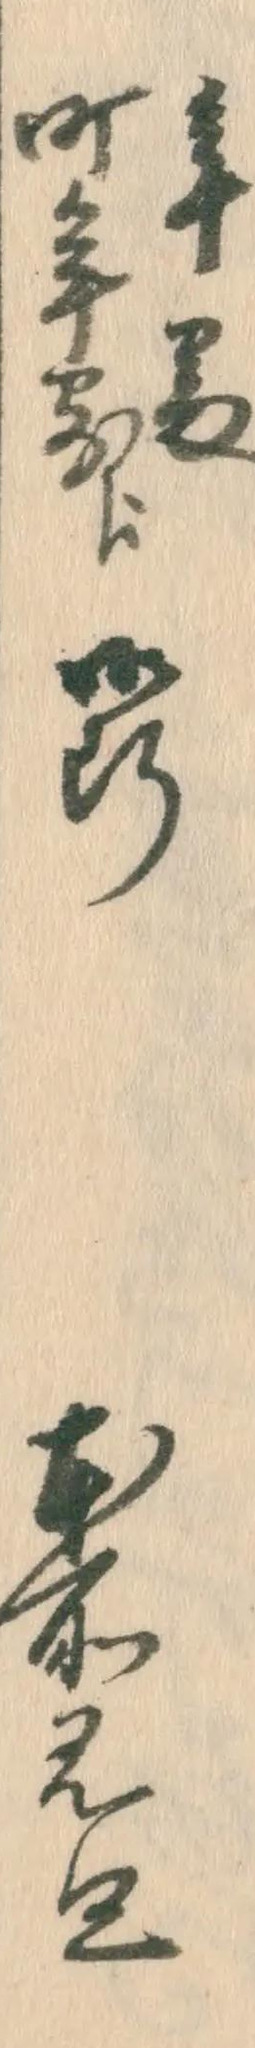町年寄え御断本所見廻
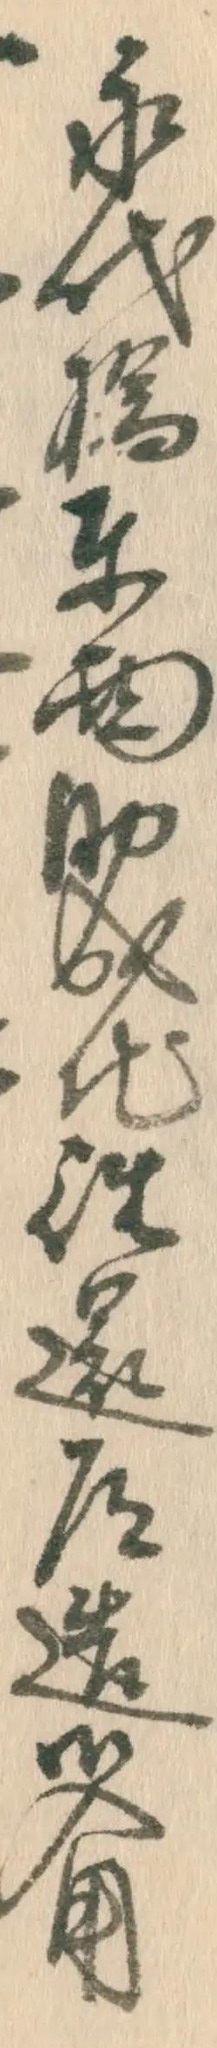永代橋東西助成地往還道造御入用
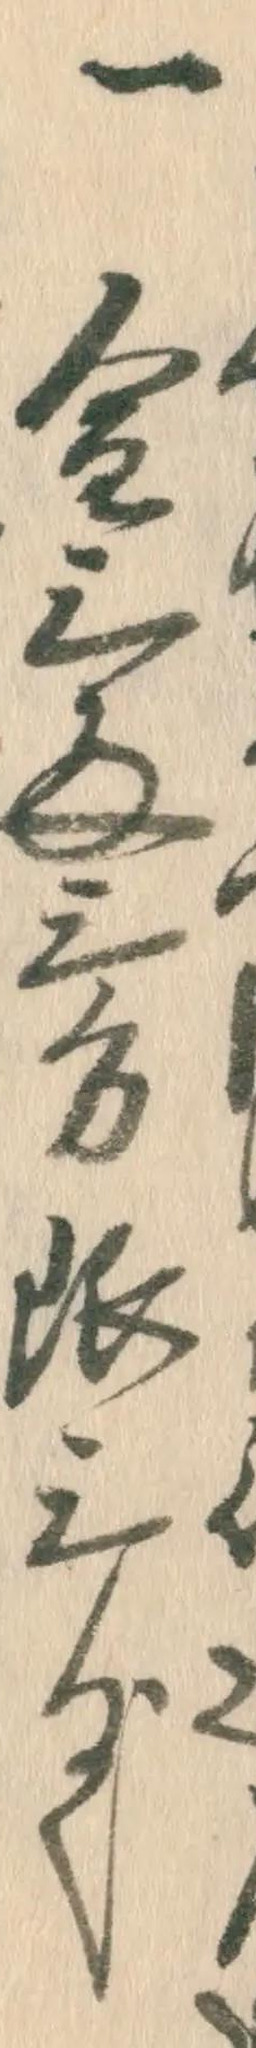一金三両三分銀三匁
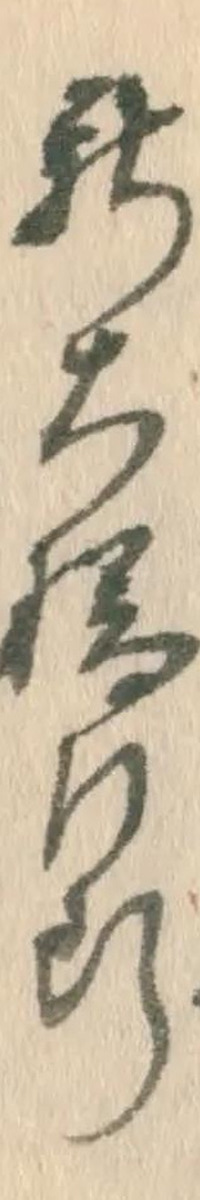新大橋同断
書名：三橋 17巻. [8] 三橋小破御修復書留　但御奉行御掛リ替地震潰橋番屋　嘉永四亥年より安政二卯年迄　下
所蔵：国立国会図書館 National Diet Library, JAPAN
